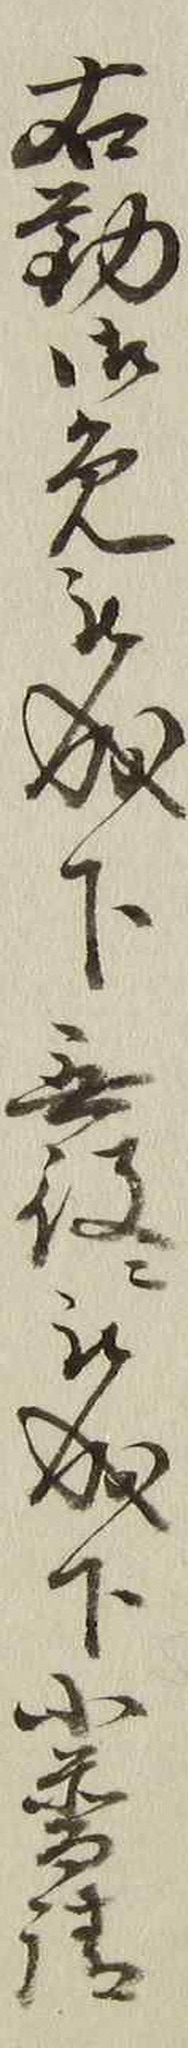右勤御免被成下無役ニ被成下小香請
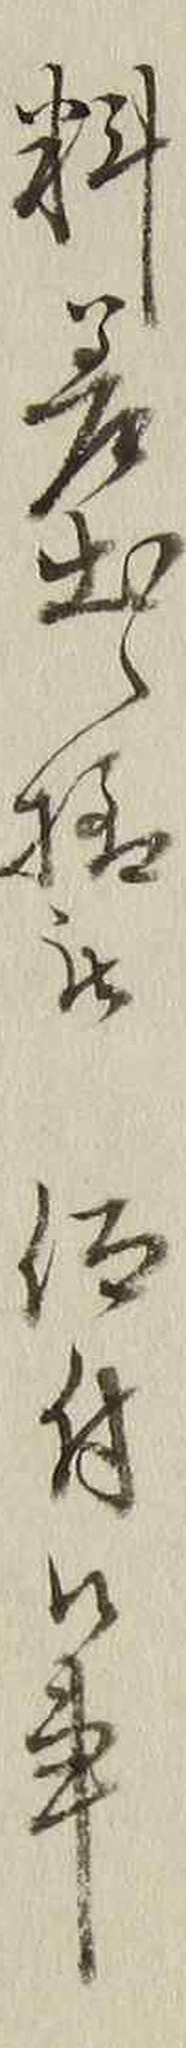料差出候様被仰付候事
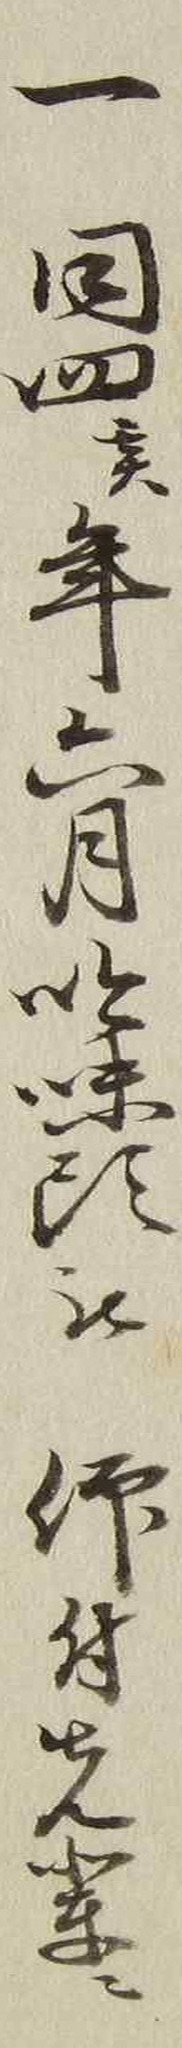一同四亥年六月吟味頭被仰付先輩ニ
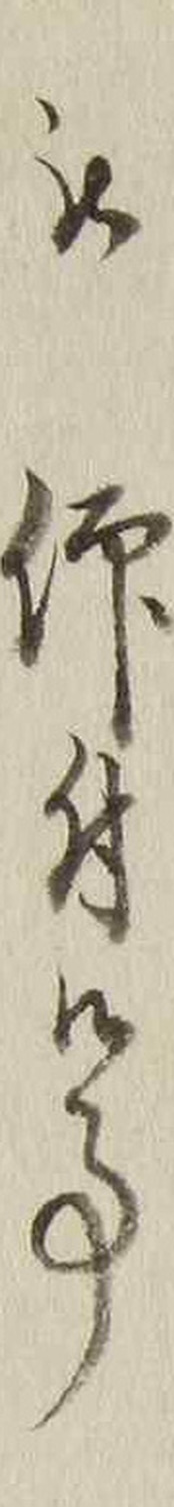被仰付候事
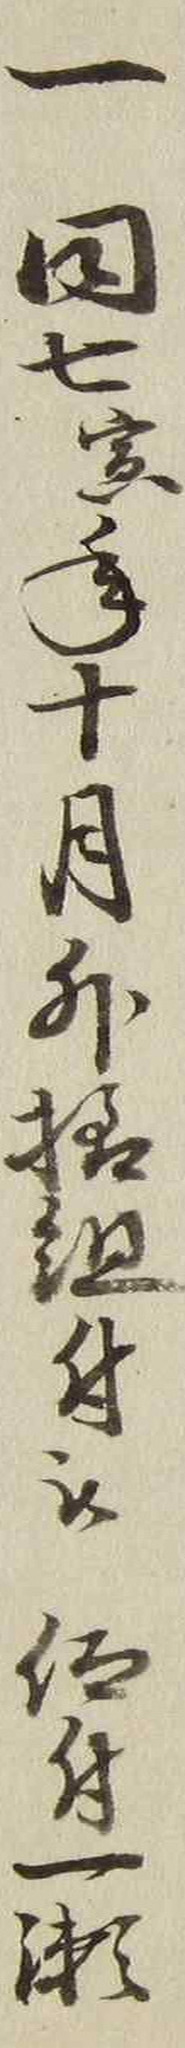一同七寅年十月外様組付被仰付一瀬
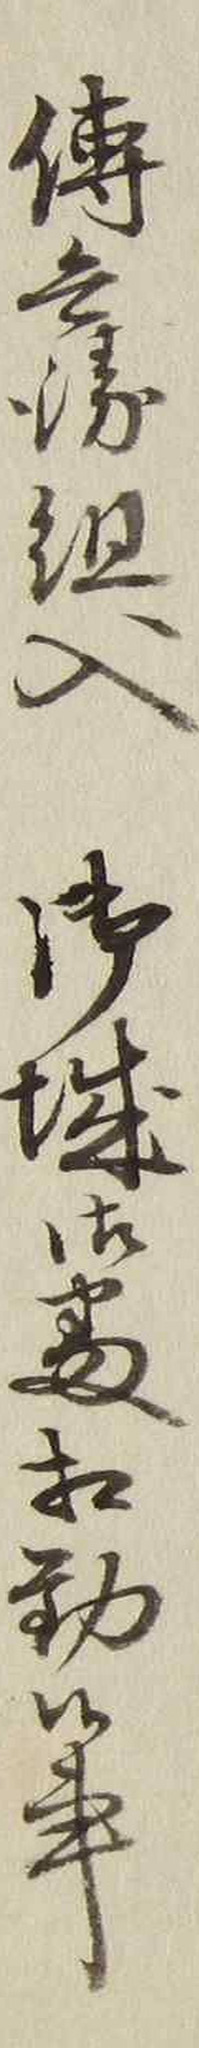伝兵衛組へ入御城御番相勤候事
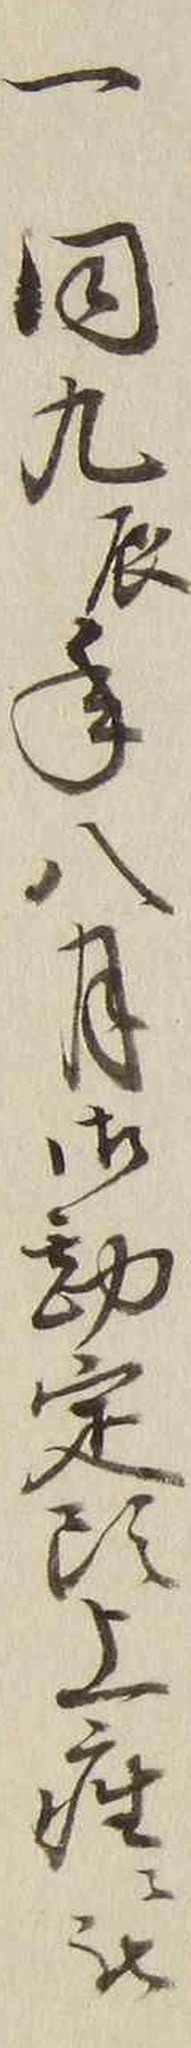一同九辰年八月御勘定頭上座ニ被

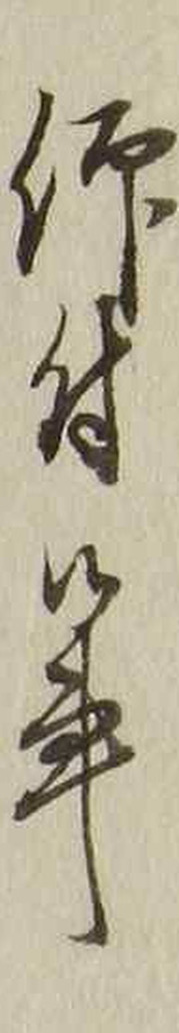仰付候事
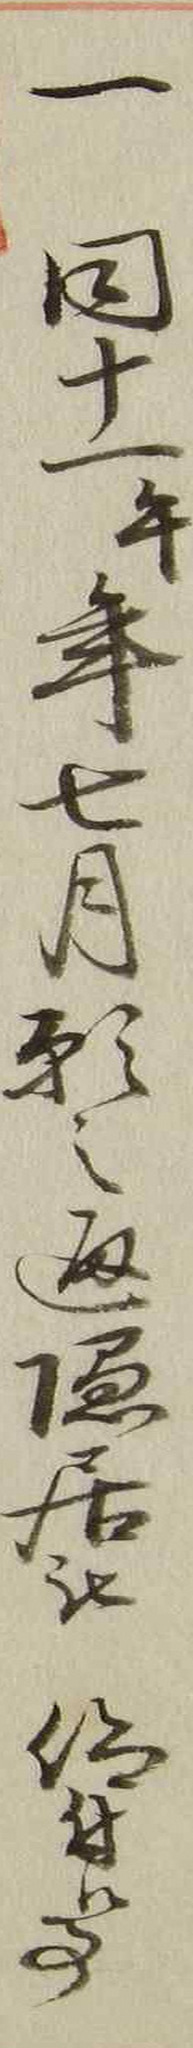一同十一午年七月願之通隠居被仰付候事
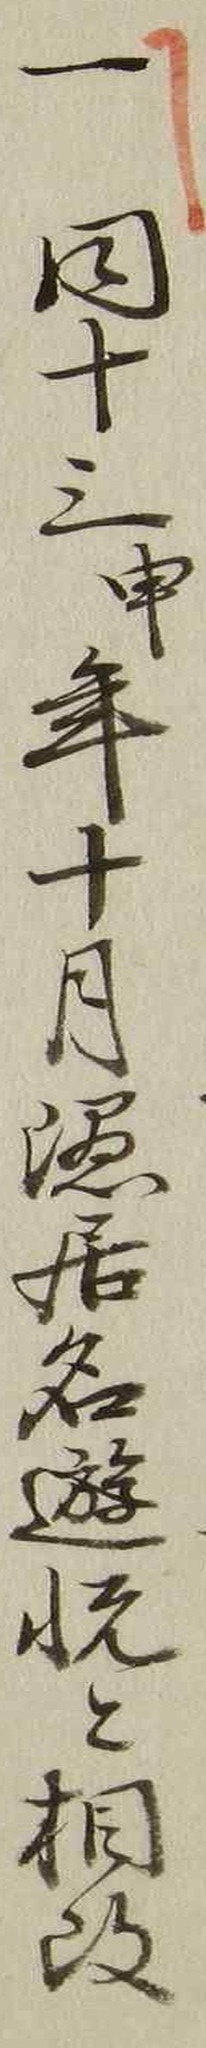一同十三申年十月隠居名遊悦と相改
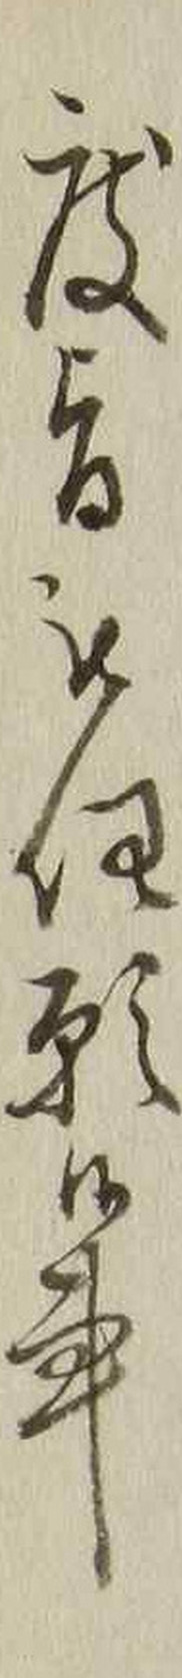度旨被任願候事
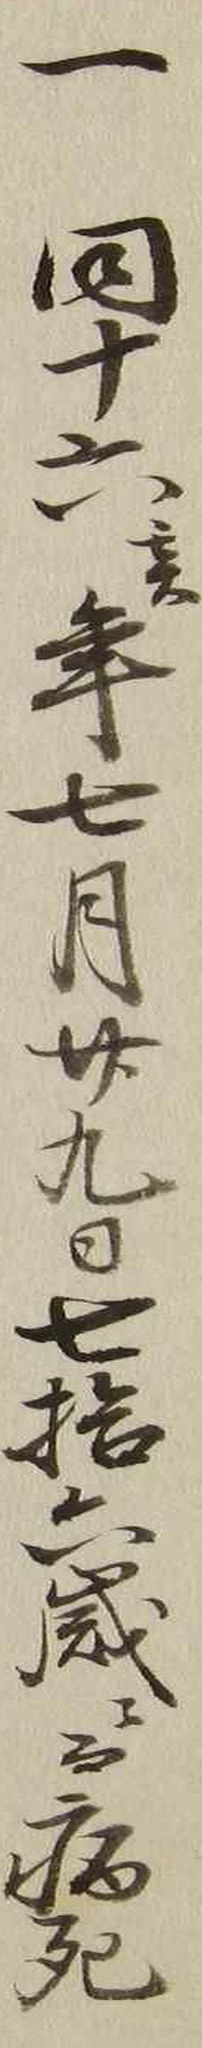一同十六亥年七月廿九日七拾六歳ニ而病死
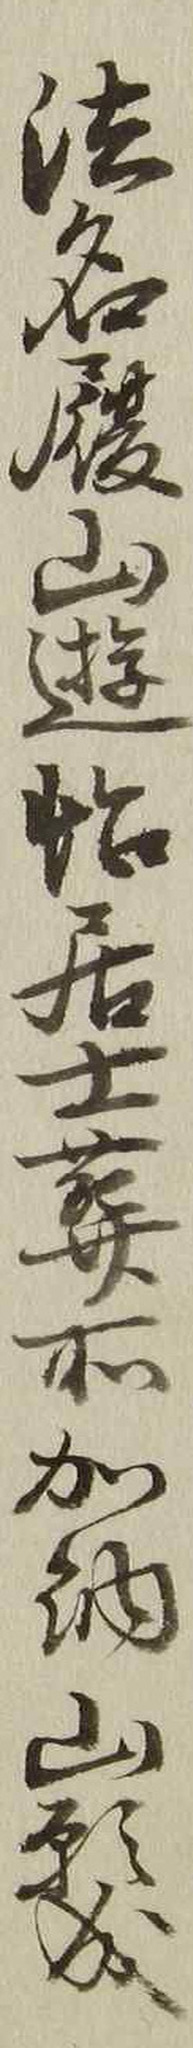法名履山遊帖居士葬所加納山願成
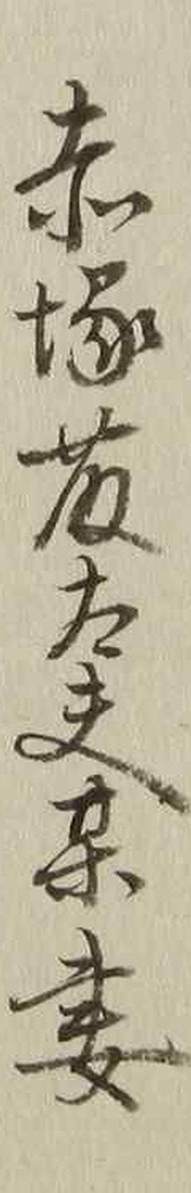女赤塚藤太夫某妻
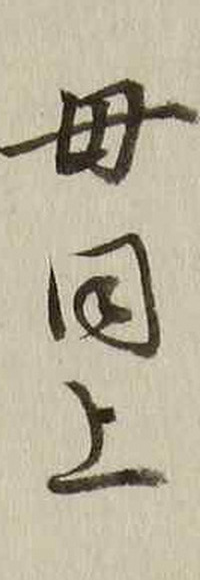母同上
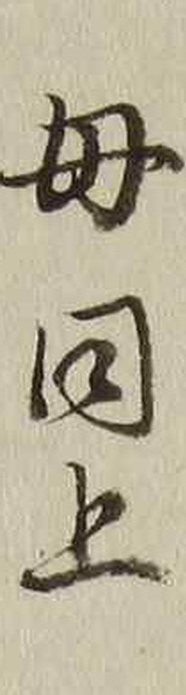母同上
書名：諸士系譜　巻之27　い之部27
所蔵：会津若松市立会津図書館
